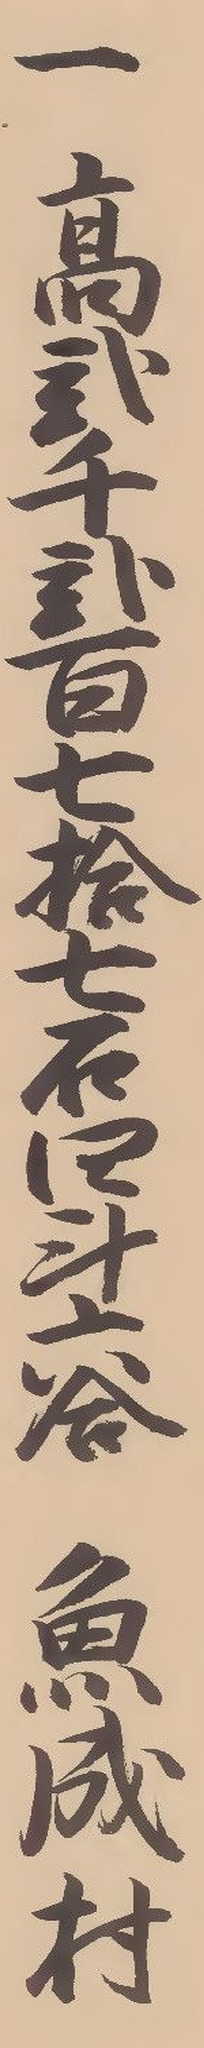一高弐千弐百七拾七石四斗六合魚成村
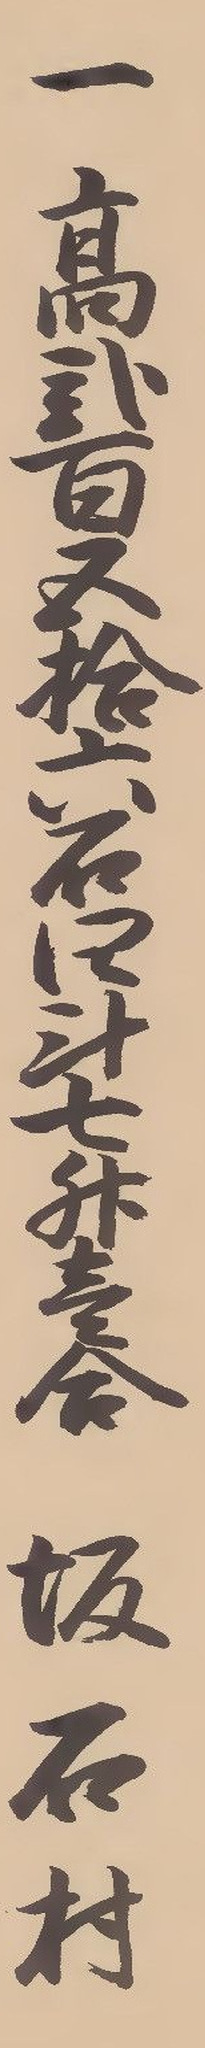一高弐百五拾六石四斗七升壱合坂石村
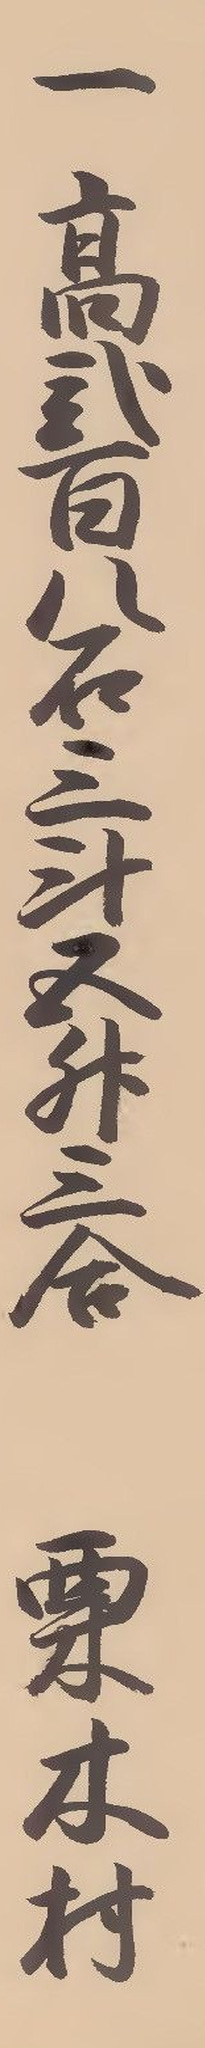一高弐百八石三斗五升三合栗木村
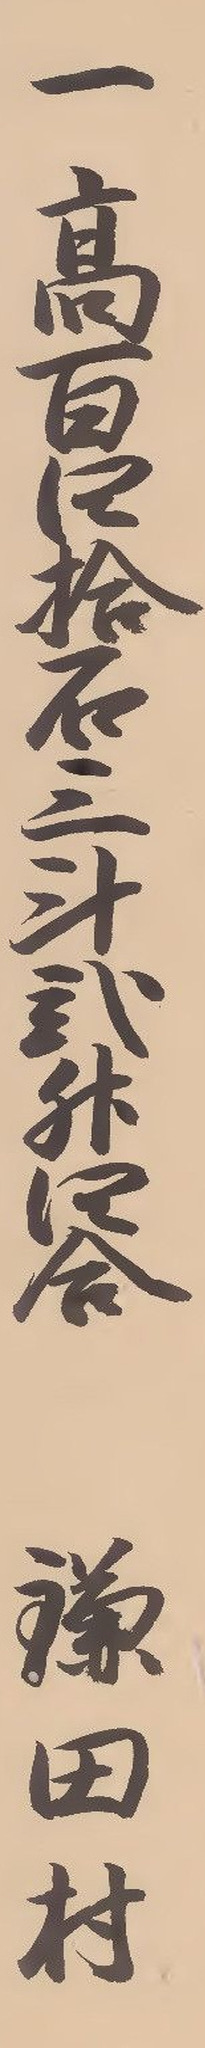一高百四拾石三斗弐升四合鎌田村
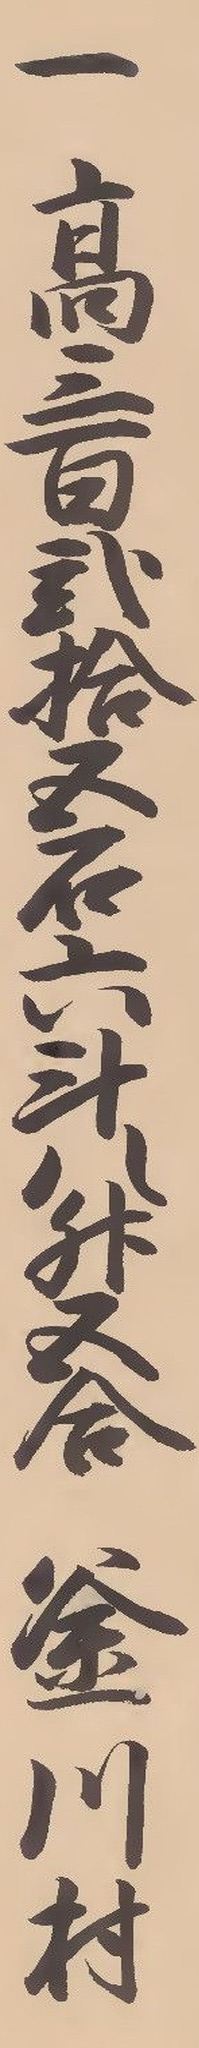一高三百弐拾五石六斗八升五合釜川村
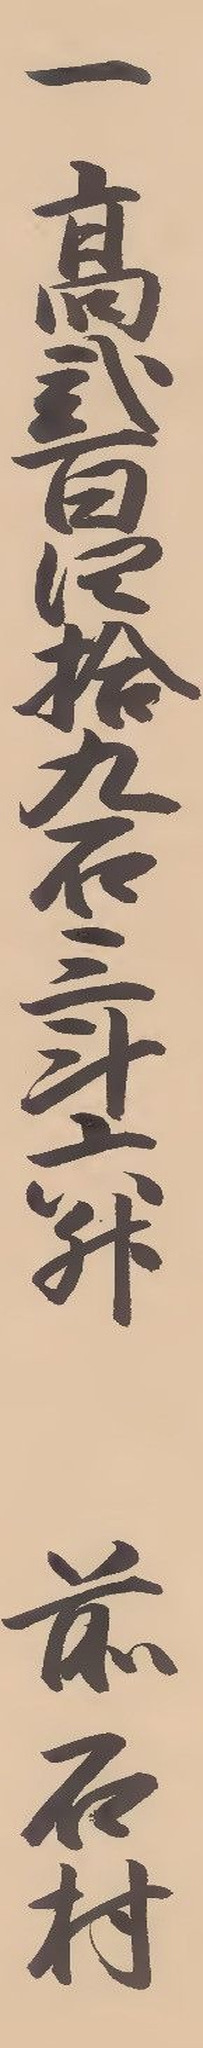一高弐百四拾九石三斗六升前石村
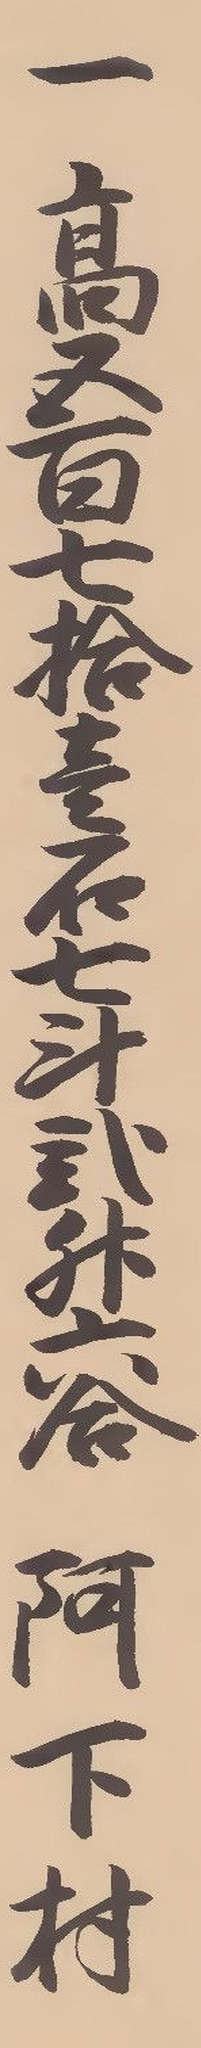一高五百七拾壱石七斗弐升六合阿下村
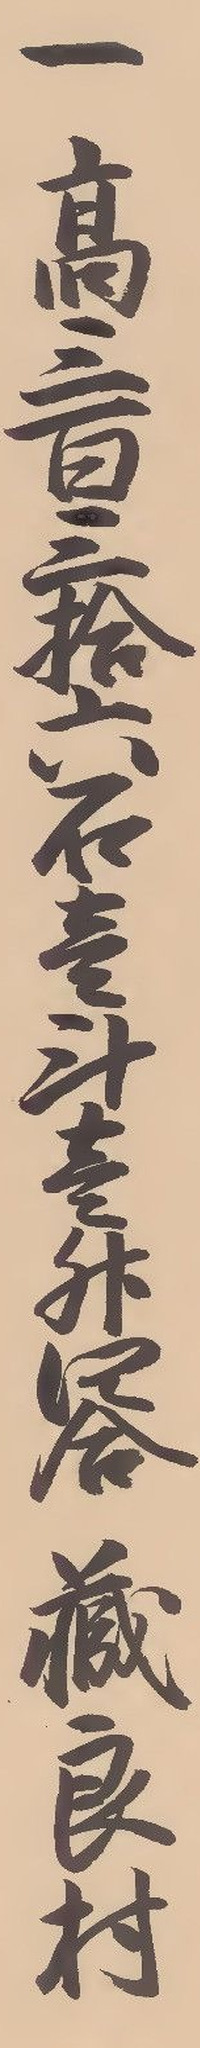一高三百三拾六石壱斗壱升四合蔵良村

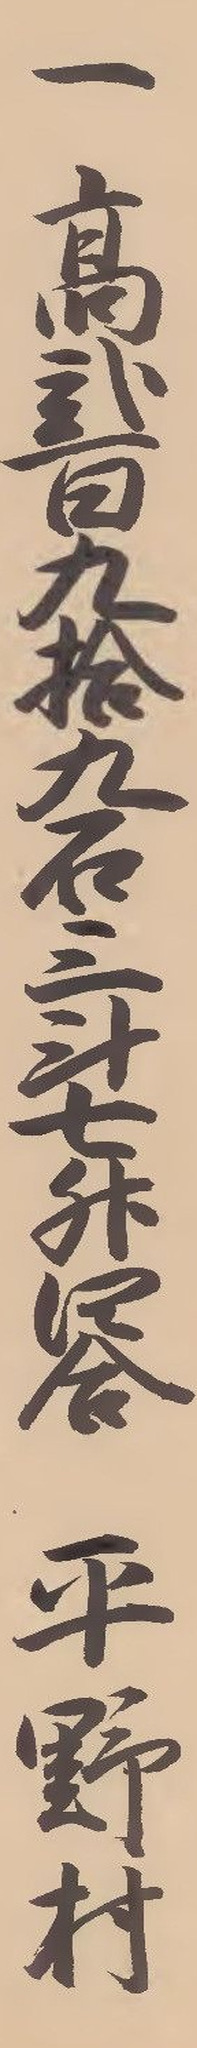一高弐百九拾九石三斗七升四合平野村
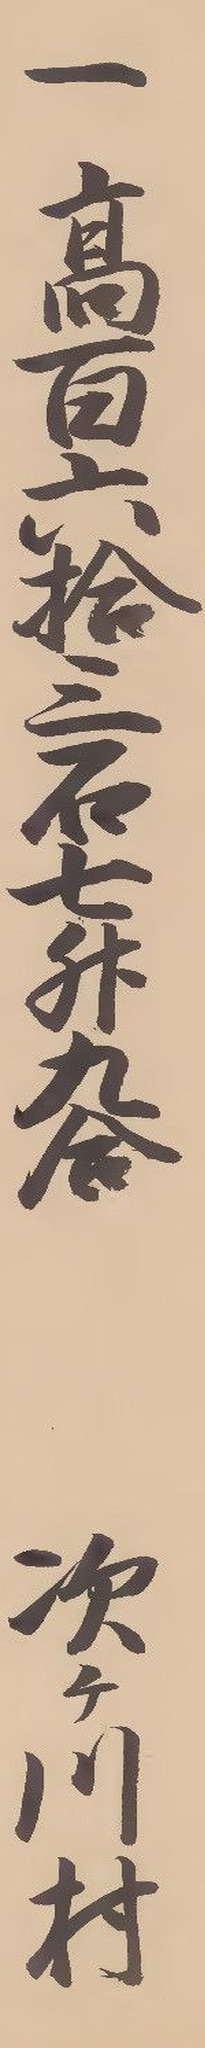一高百六拾三石七升九合次ヶ川村
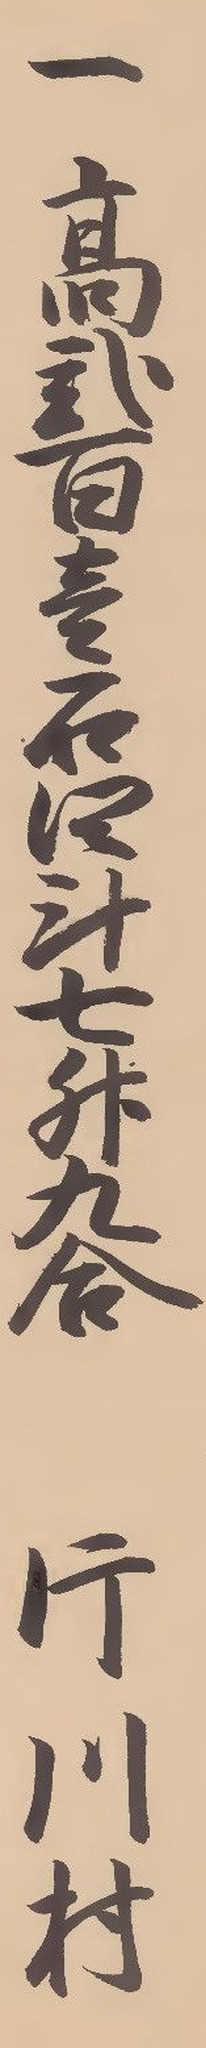一高弐百壱石四斗七升九合片川村
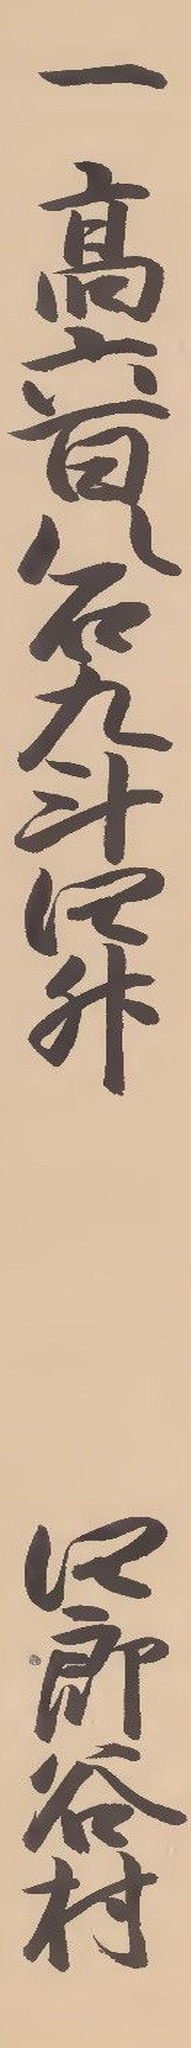一高六百八石九斗四升四郎谷村
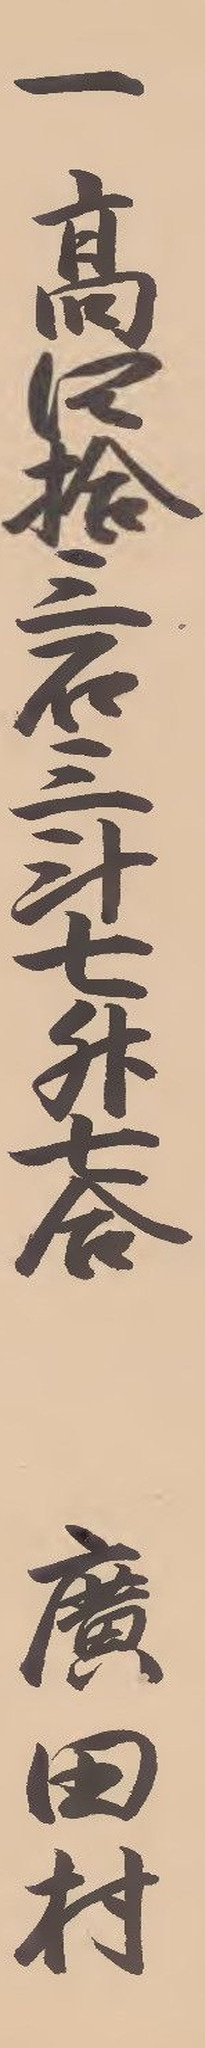一高四拾三石三斗七升七合広田村
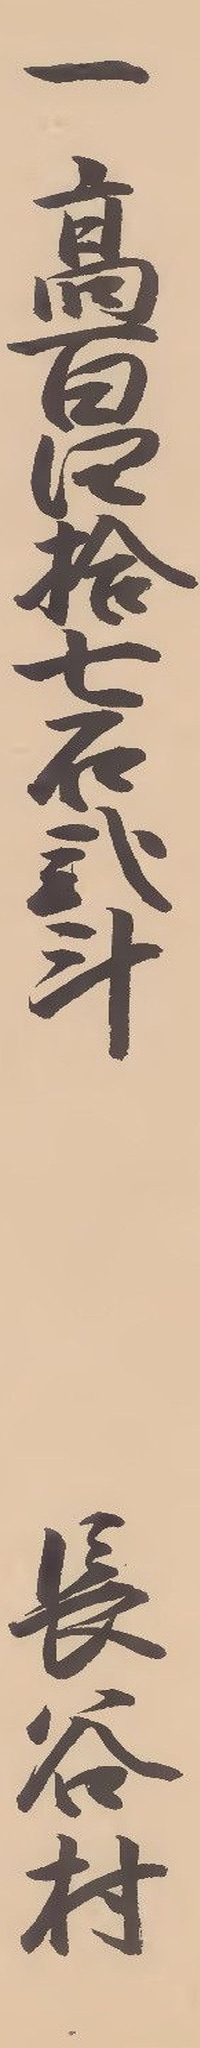一高百四拾七石弐斗長谷村
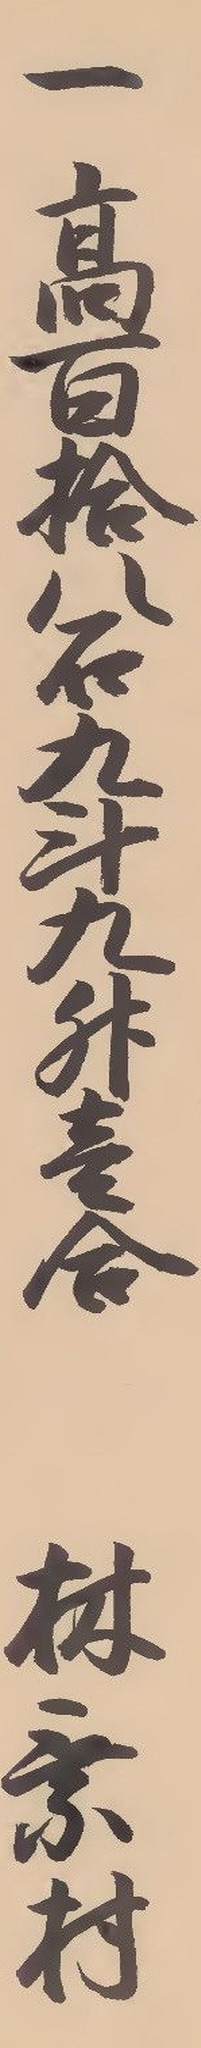一高百拾八石九斗九升壱合林乗村

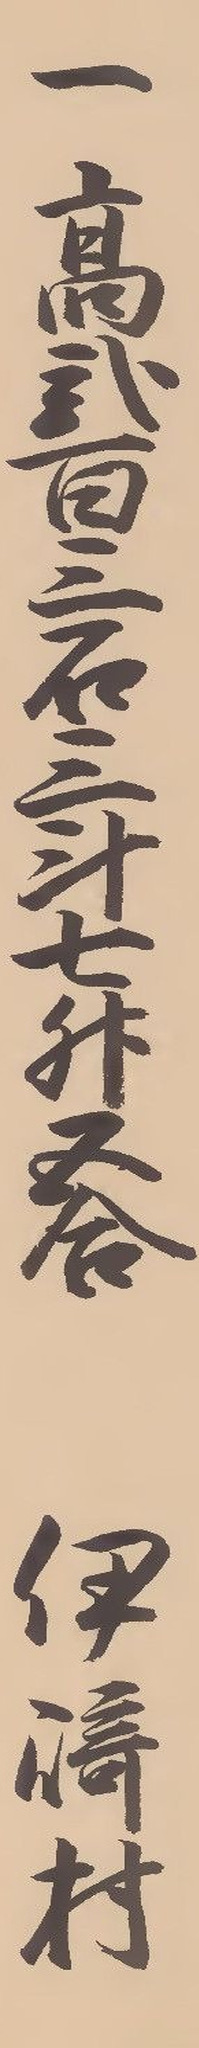一高弐百三石三斗七升五合伊崎村
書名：伊予国郷帳
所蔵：国立公文書館 National Archives of Japan
